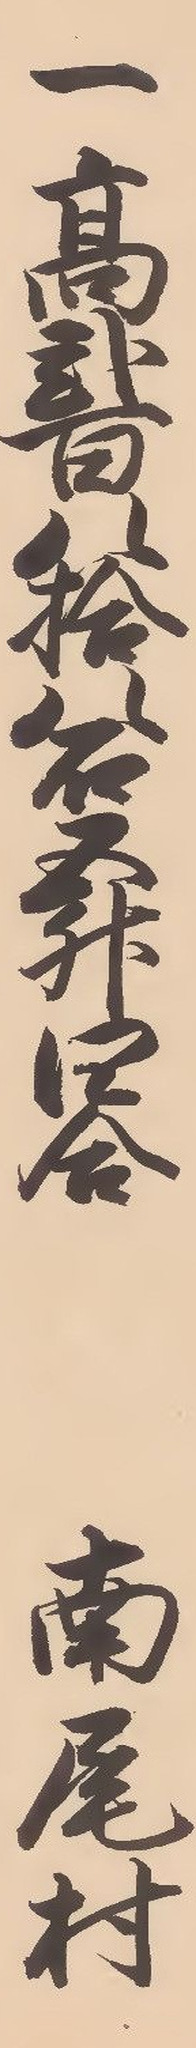一高弐百八拾八石五升四合南尾村
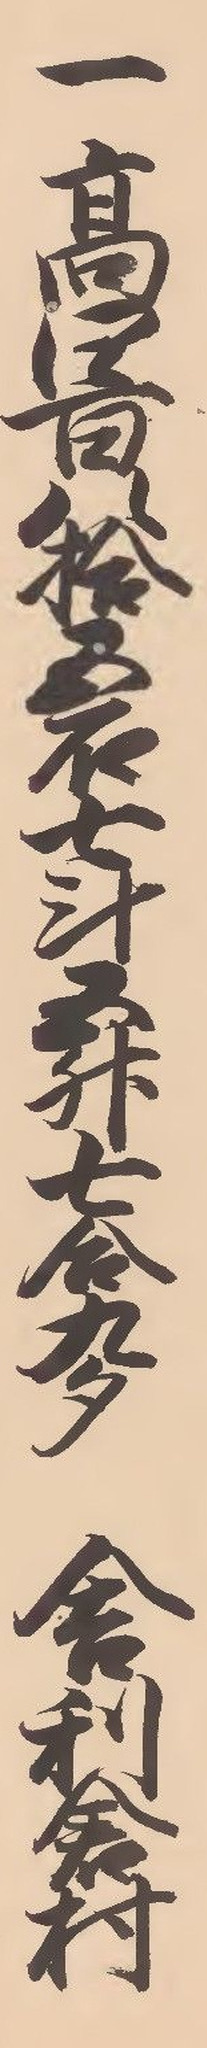一高四百八拾五石七斗五升七合九勺舎利倉村
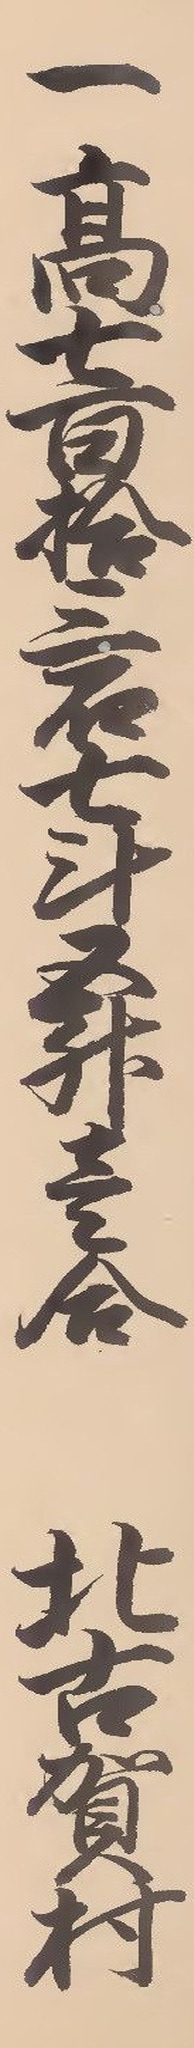一高七百拾三石七斗五升壱合北古賀村
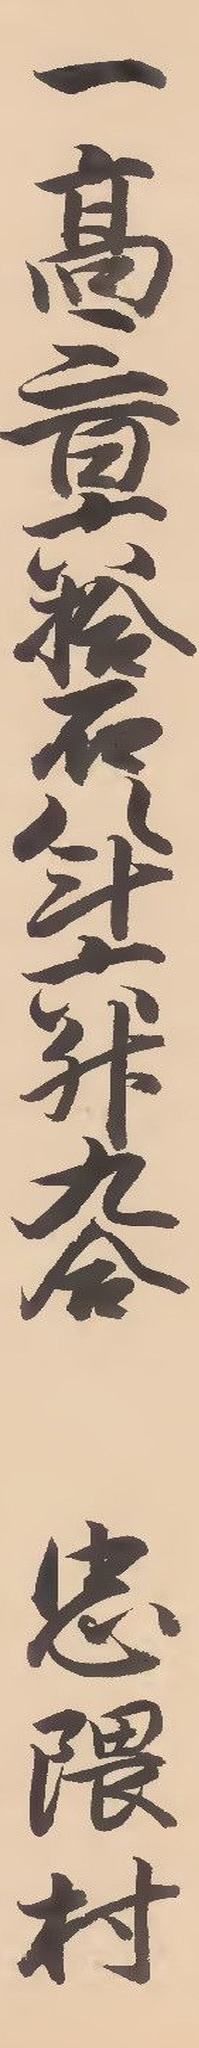一高三百六拾石八斗六升九合忠隈村
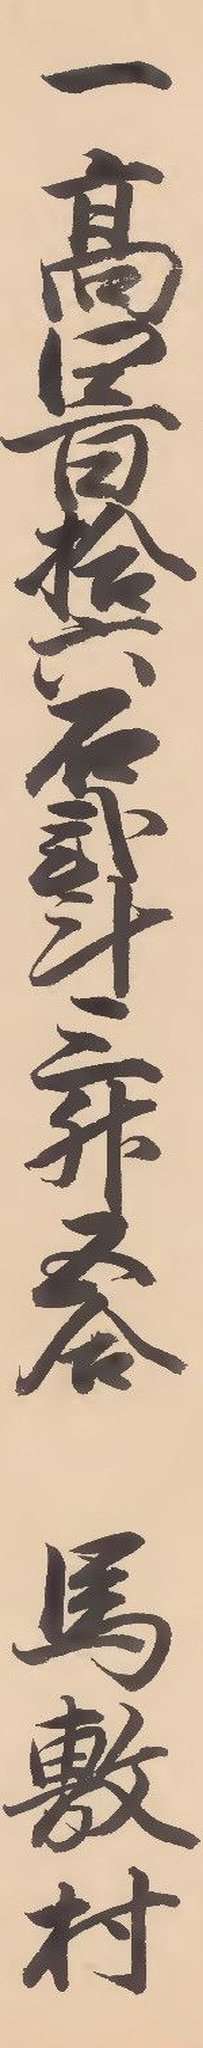一高四百拾六石弐斗三升五合馬敷村
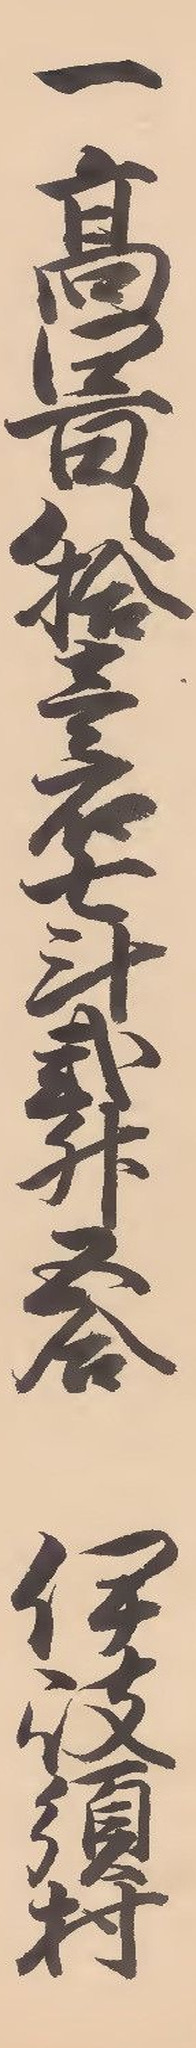一高四百八拾壱石七斗弐升五合伊岐須村

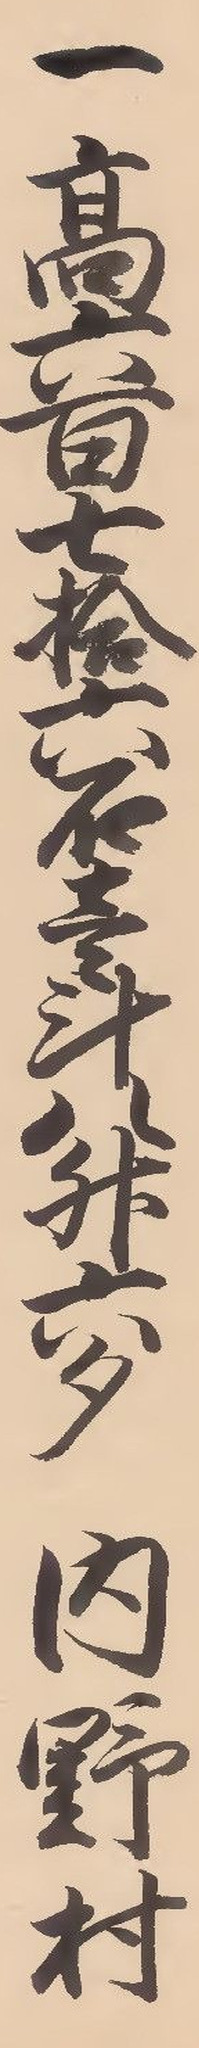一高六百七拾六石壱斗八升六勺内野村
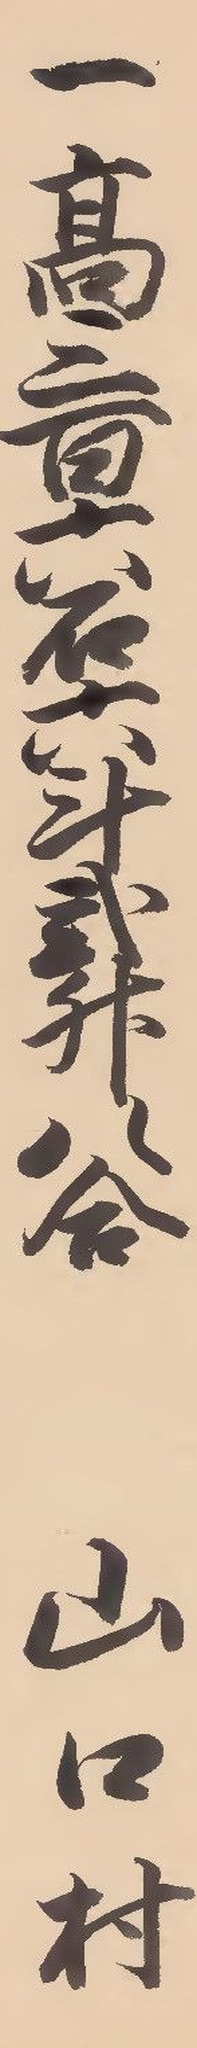一高三百六石六斗弐升八合山口村
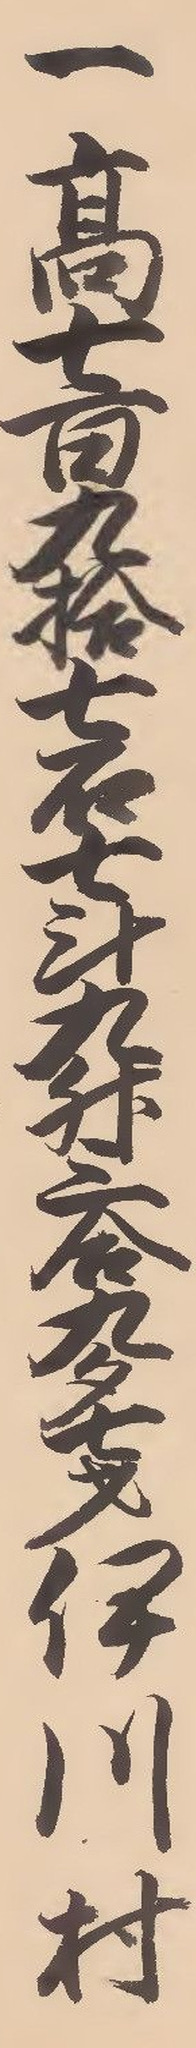一高七百九拾七石七斗九升三合九勺七才伊川村
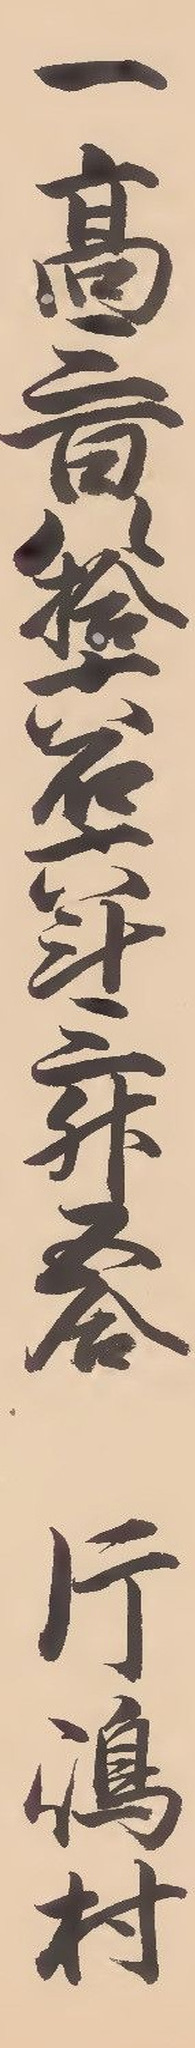一高三百八拾六石六斗三升五合片島村
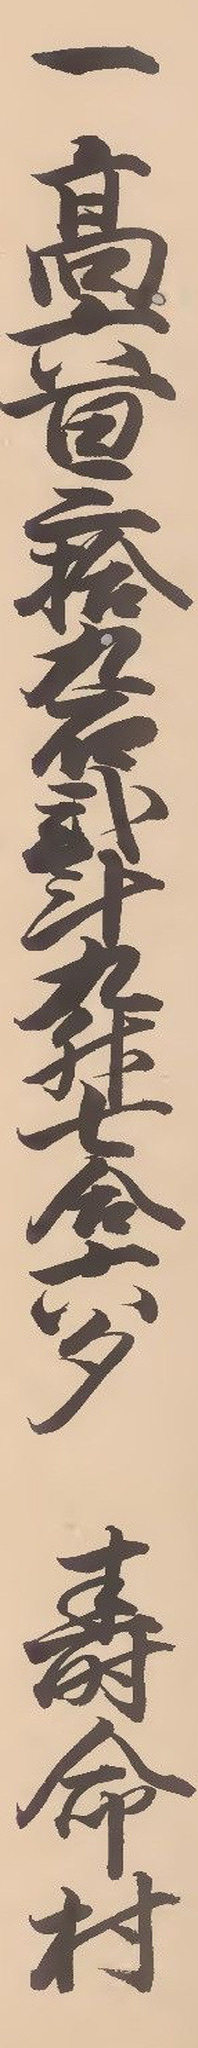一高六百三拾九石弐斗九升七合六勺寿命村
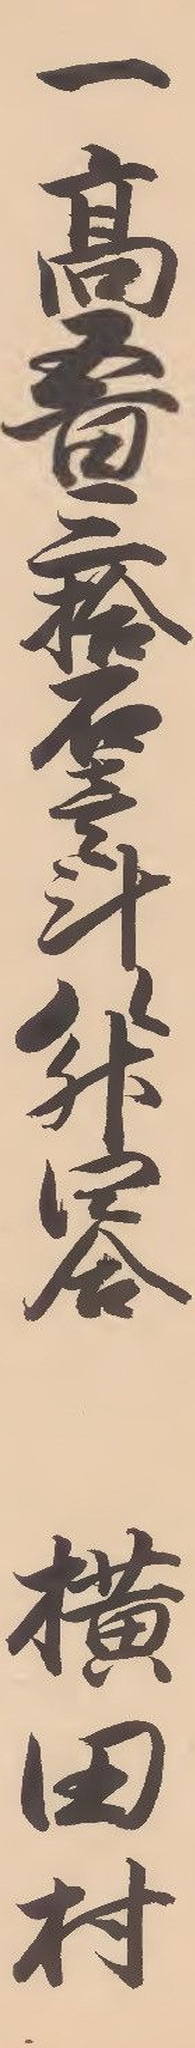一高五百三拾石壱斗八升四合横田村
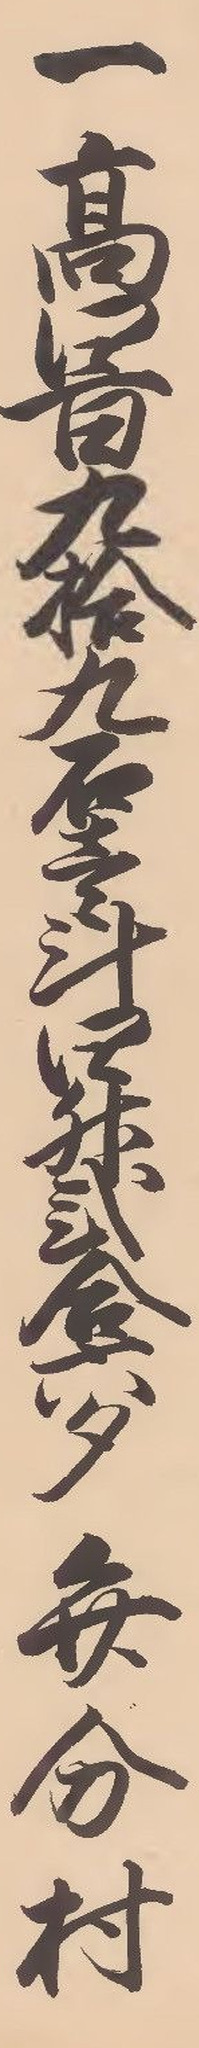一高四百九拾九石壱斗四升弐合六勺弁分村

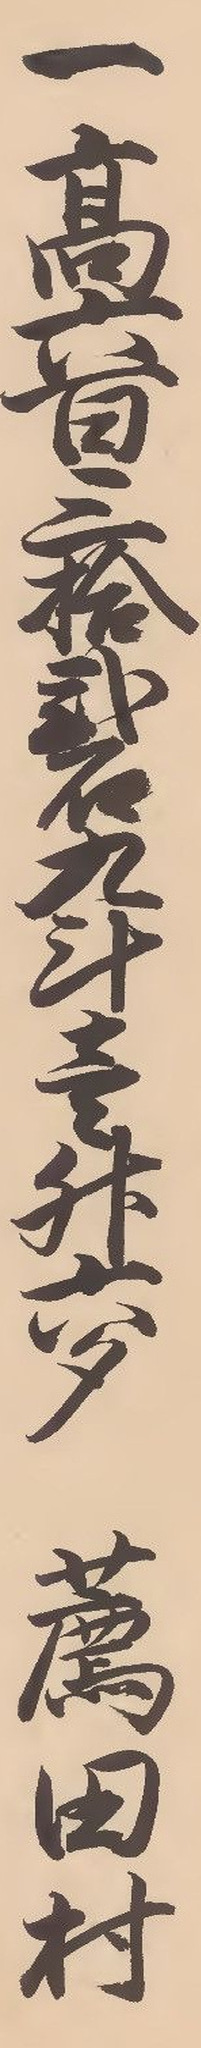一高六百三拾弐石九斗壱升六勺薦田村
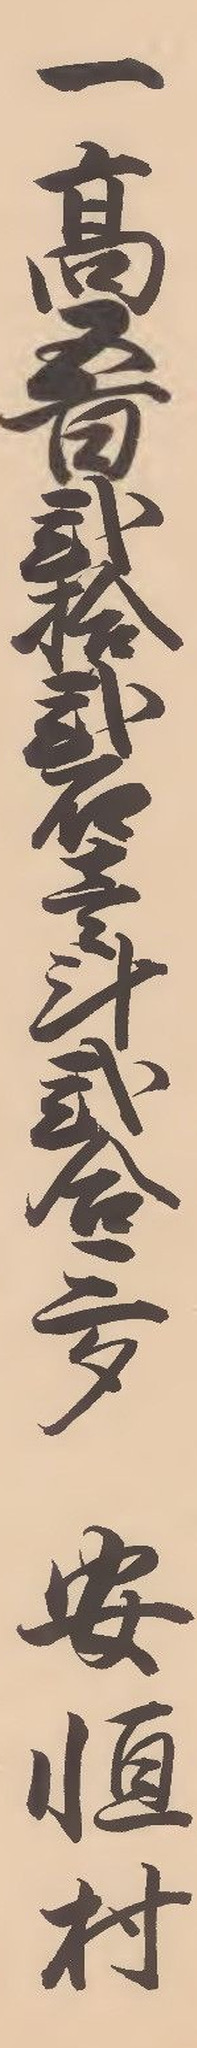一高五百弐拾弐石壱斗弐合三勺安恒村
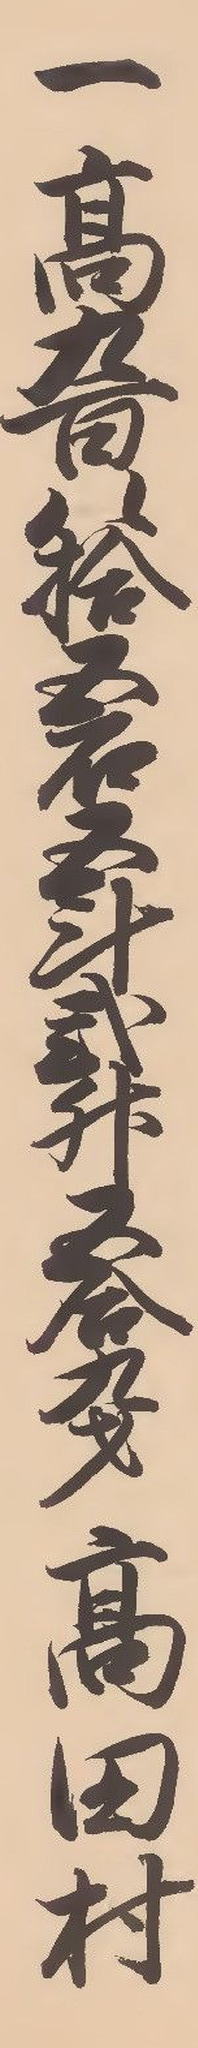一高九百八拾五石五斗弐升五合九才高田村
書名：筑前国郷帳
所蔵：国立公文書館 National Archives of Japan
